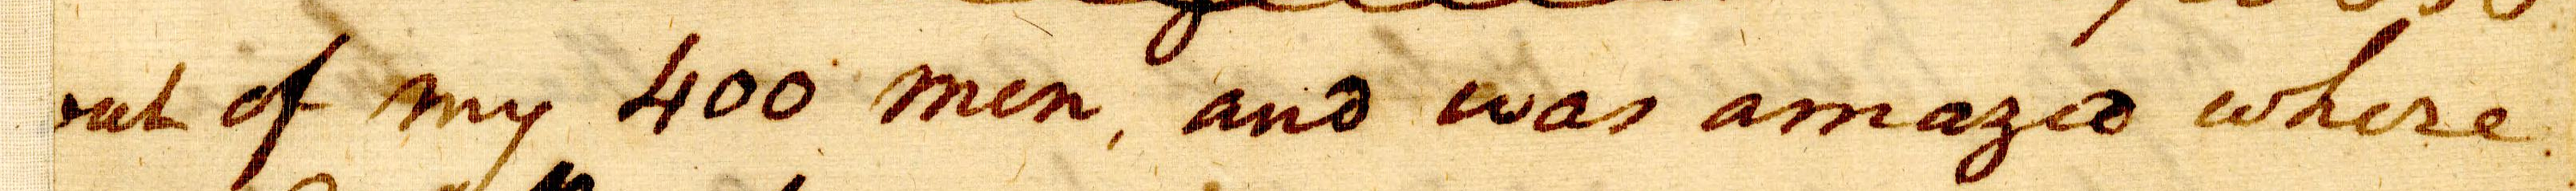out of my 400 men, and was amazed where
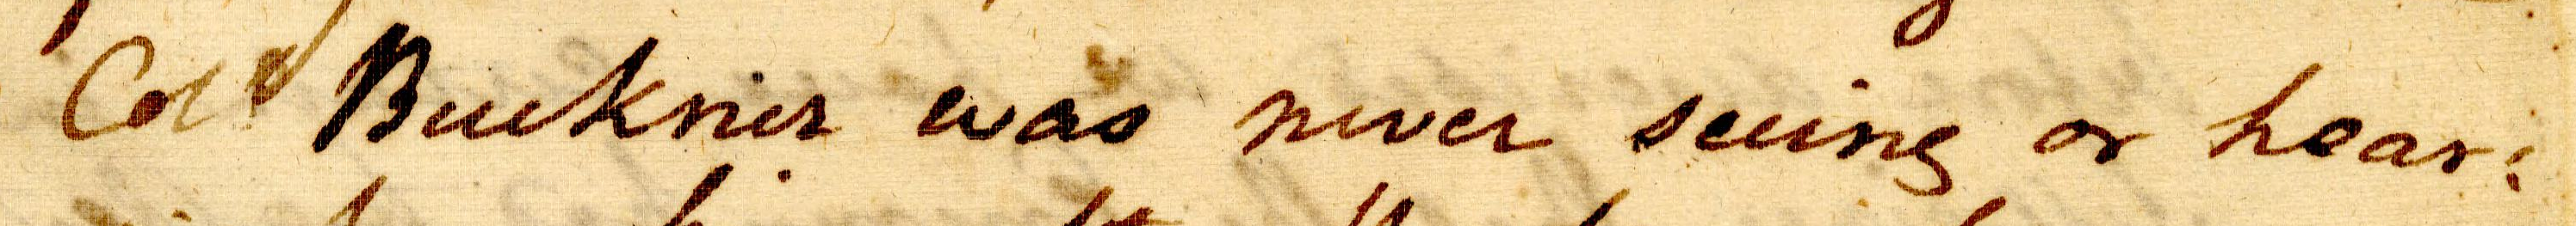Col^o Buckner was never seeing or hear-
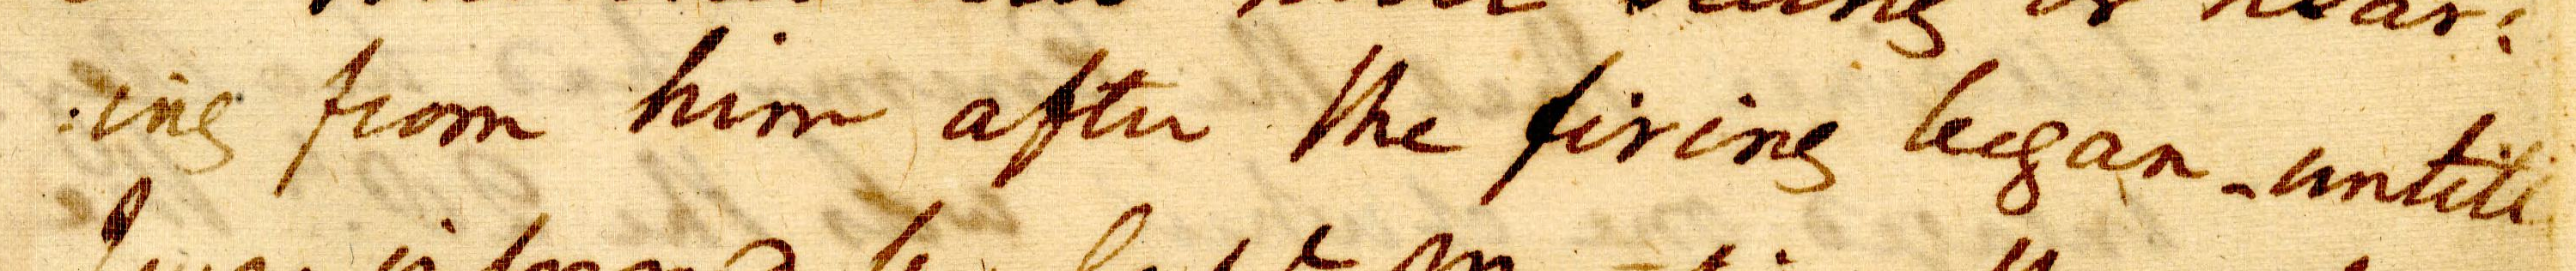-ing from him after the firing began, untill
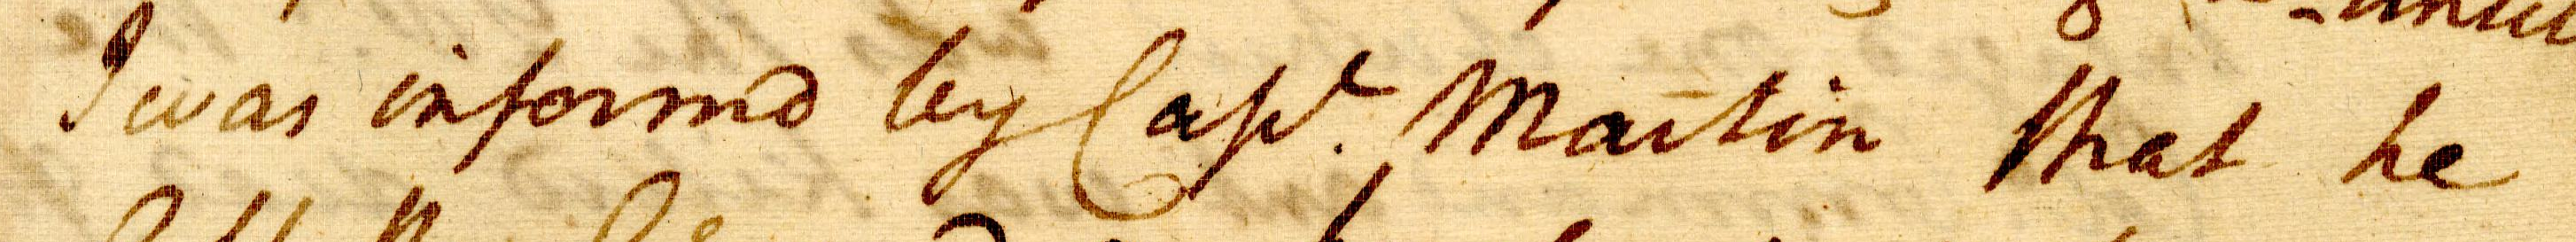I was informd by Cap^t. Martin that he
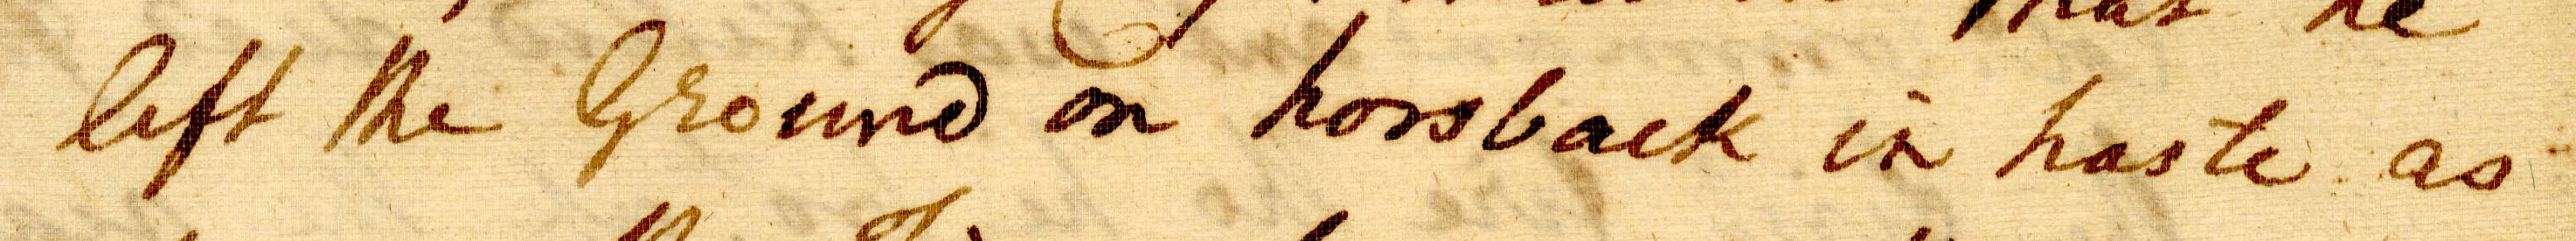left the Ground on horsback in haste as
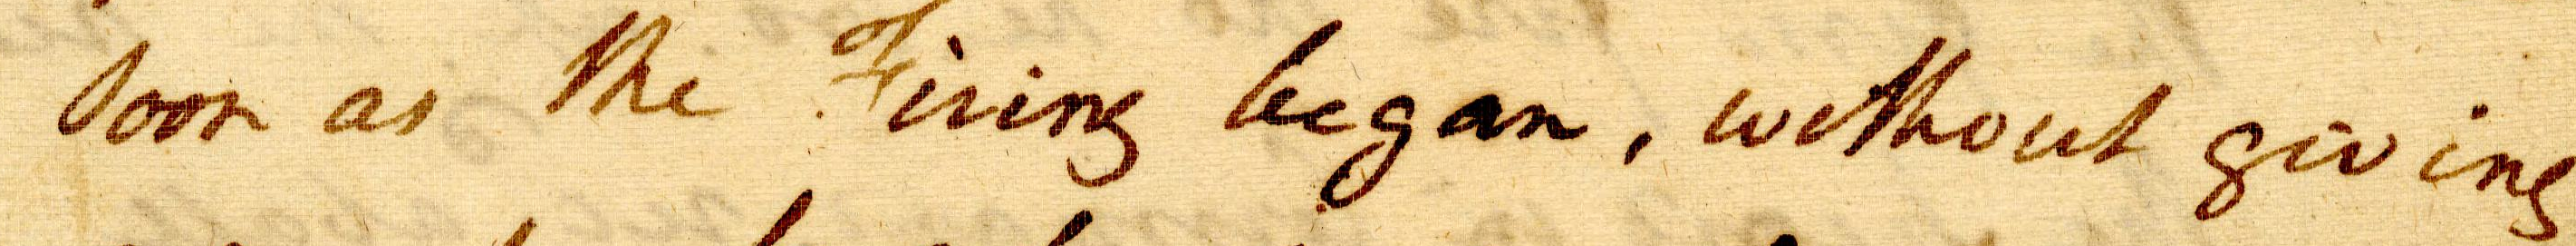soon as the Firing began, without giving
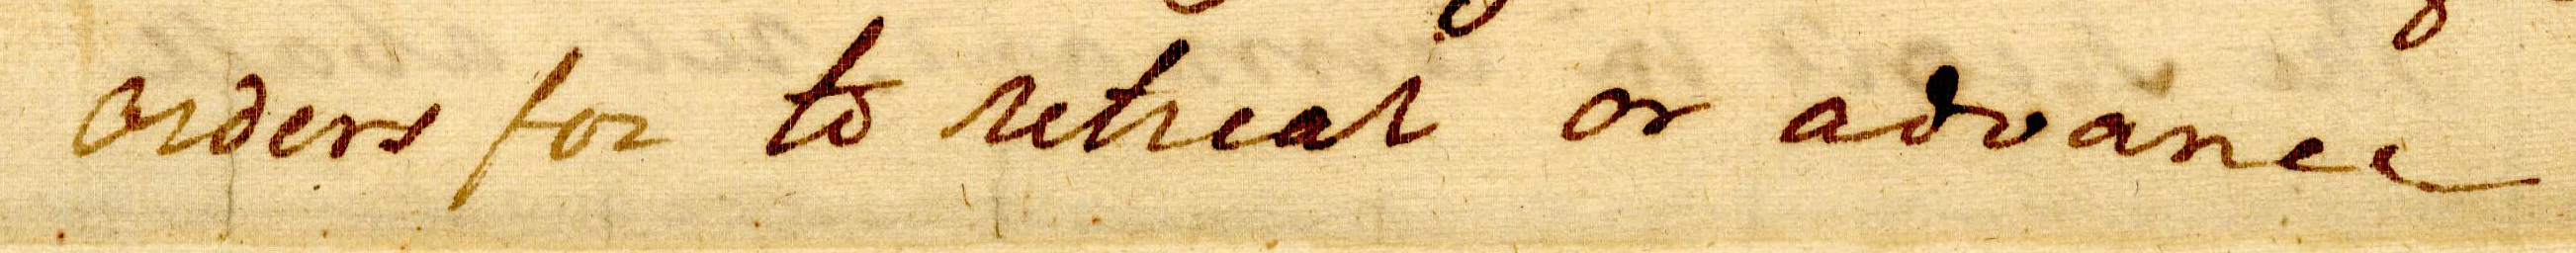orders for to retreat or advance
